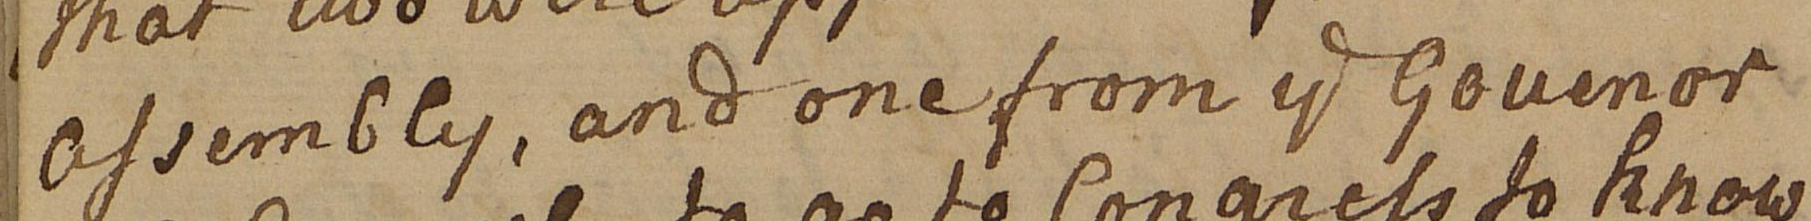Assembly, and one from y^e Govenor
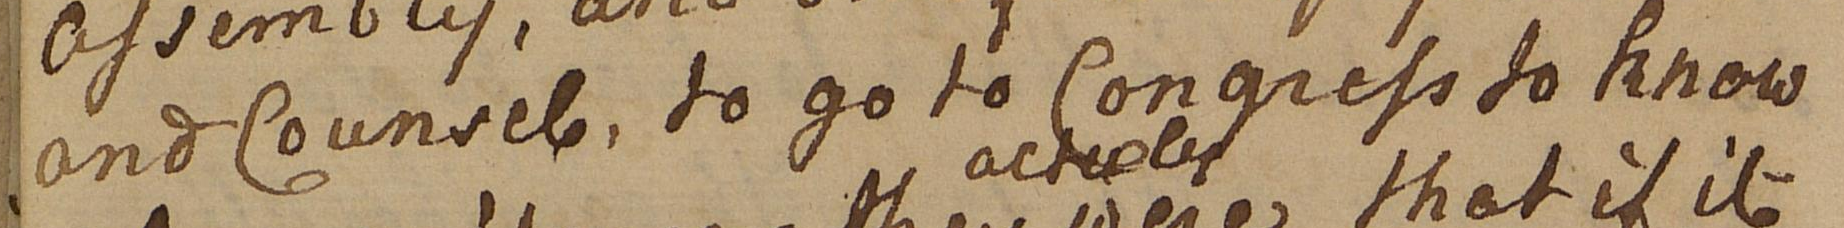and Counsel, to go to Congress to know
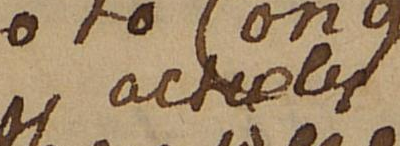actuly
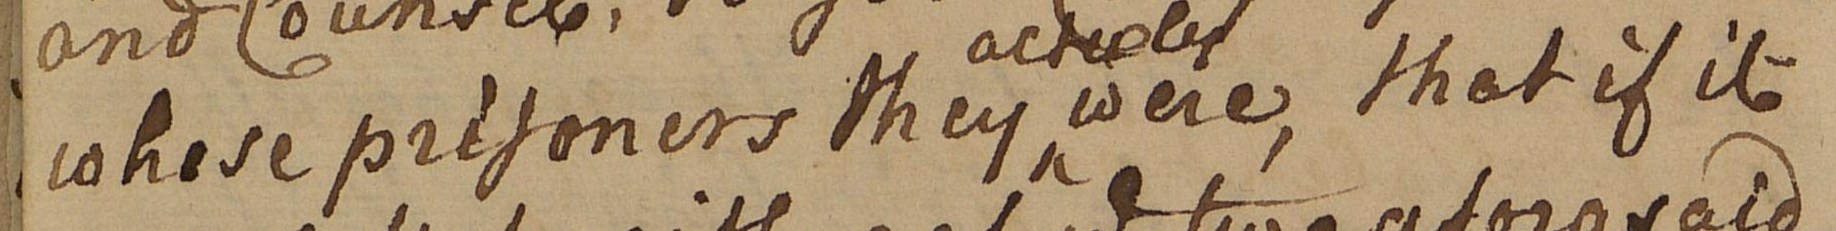whose prisoners they ^ were, that if it
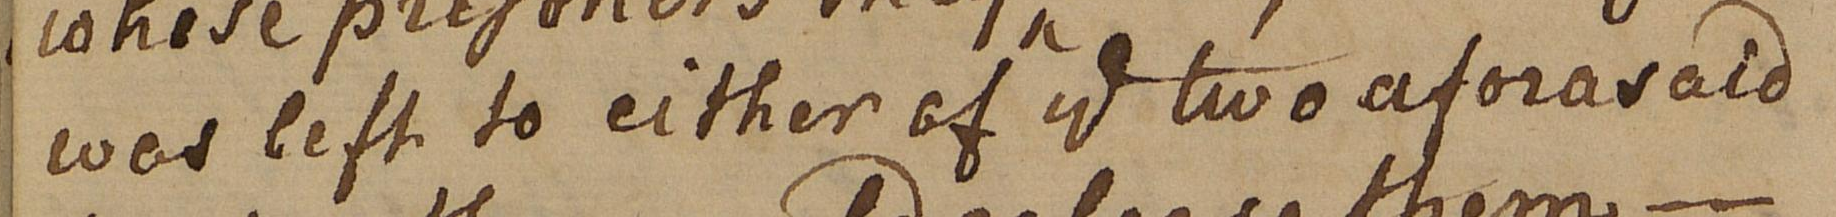was left to either of y^e two aforasaid
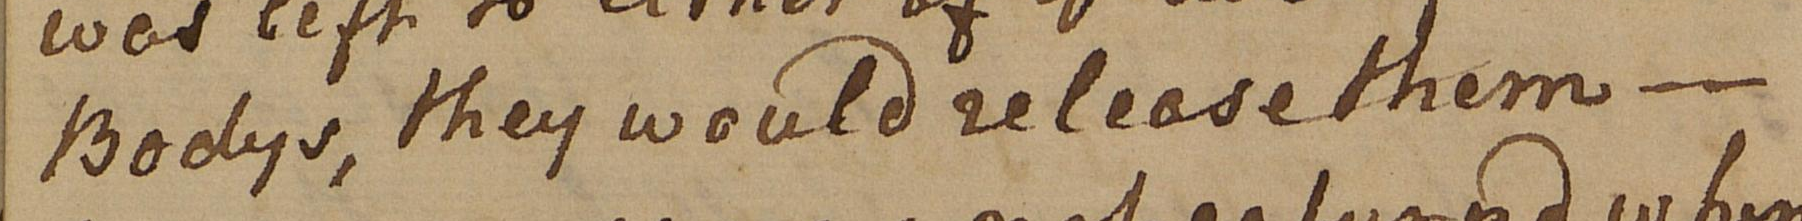Bodys, they would release them-
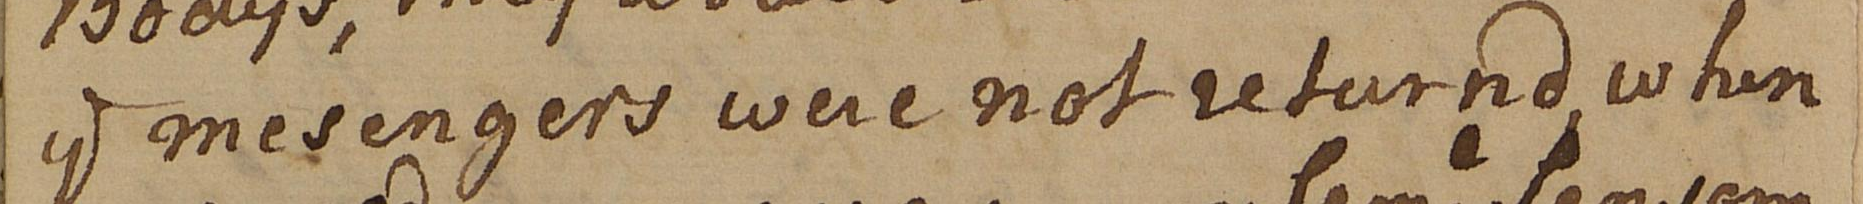y^e mesengers were not returnd when
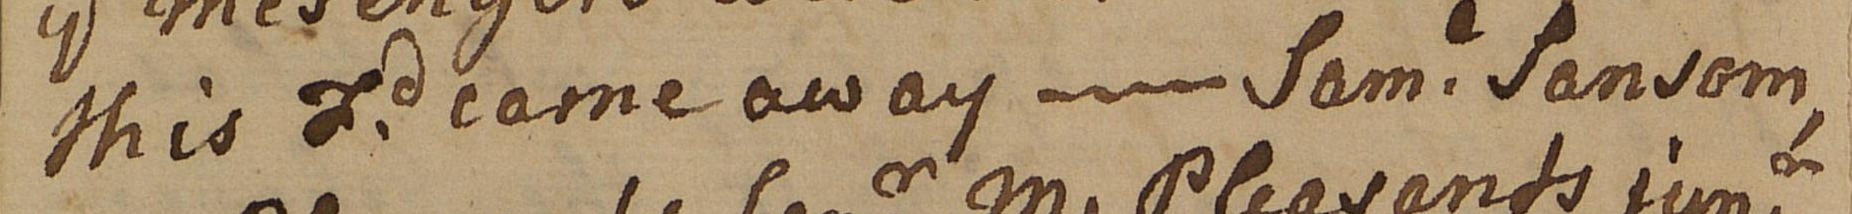this F^d. came away- Sam^l. Sansom,
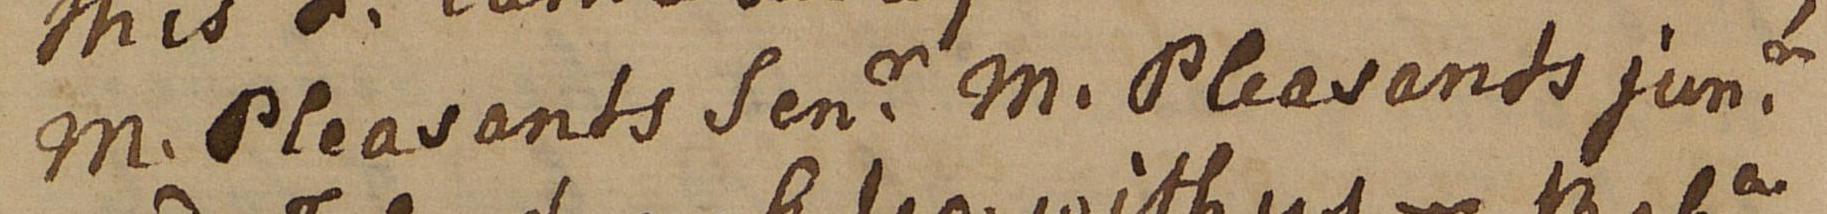M. Pleasants Sen^r. M. Pleasands jun^r.
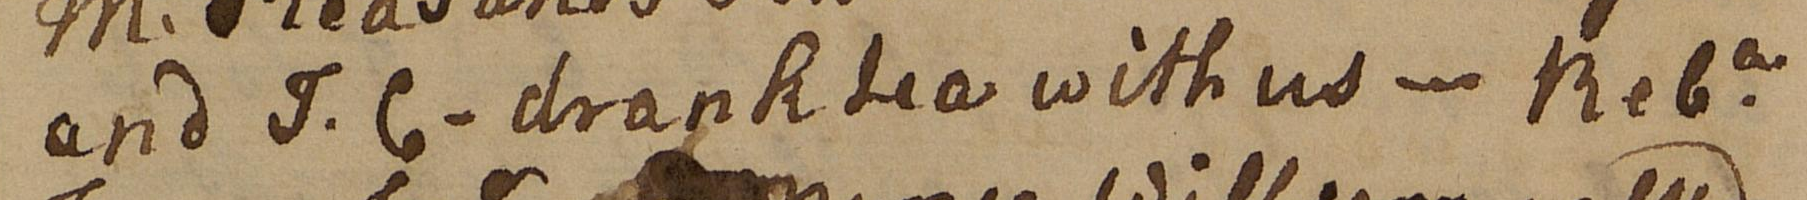and J. C- drank tea with us- Reb^a.
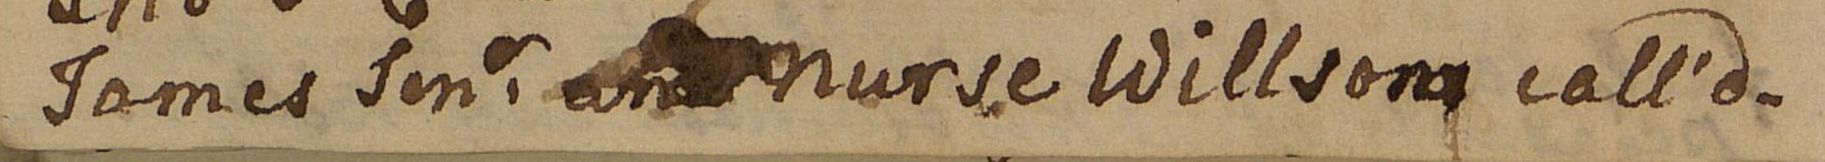James Sen^r. [___] nurse Willsons call'd-
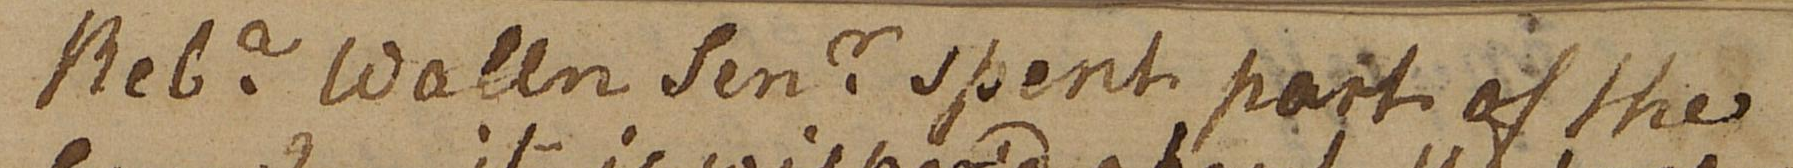Reb^a. Walln Sen^r. spent part of the
